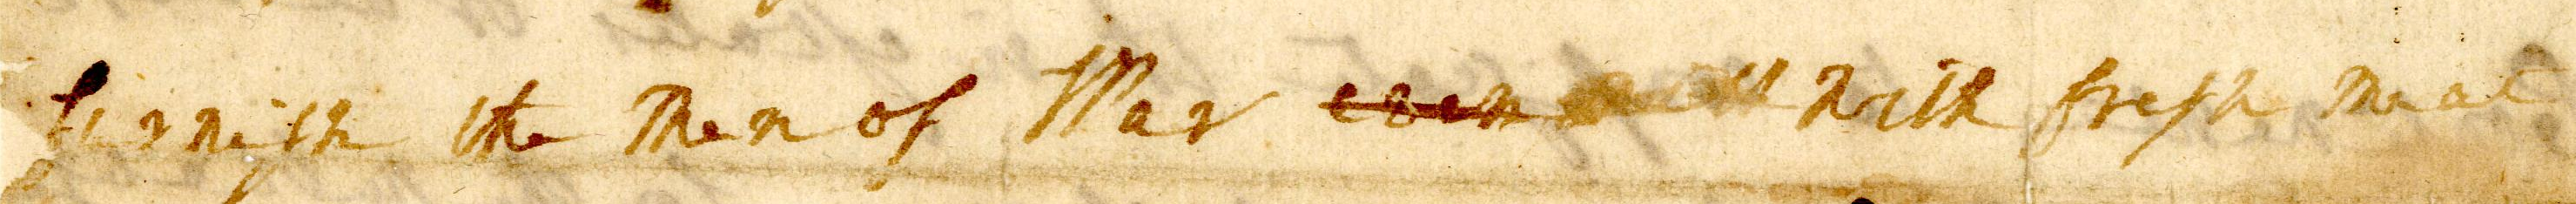fight the men of War [____] [____] with fresh most
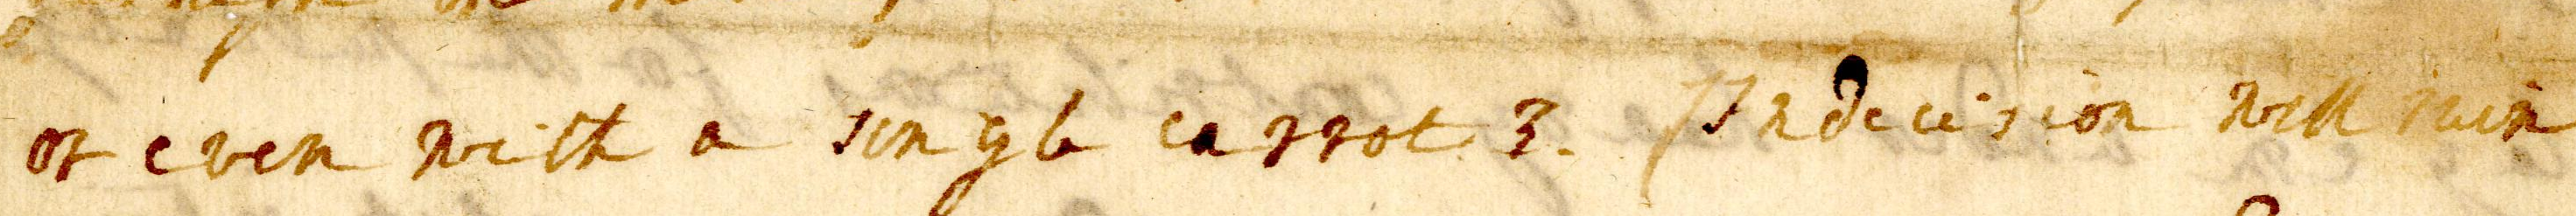or even with a single carrot? Indecision will ruin
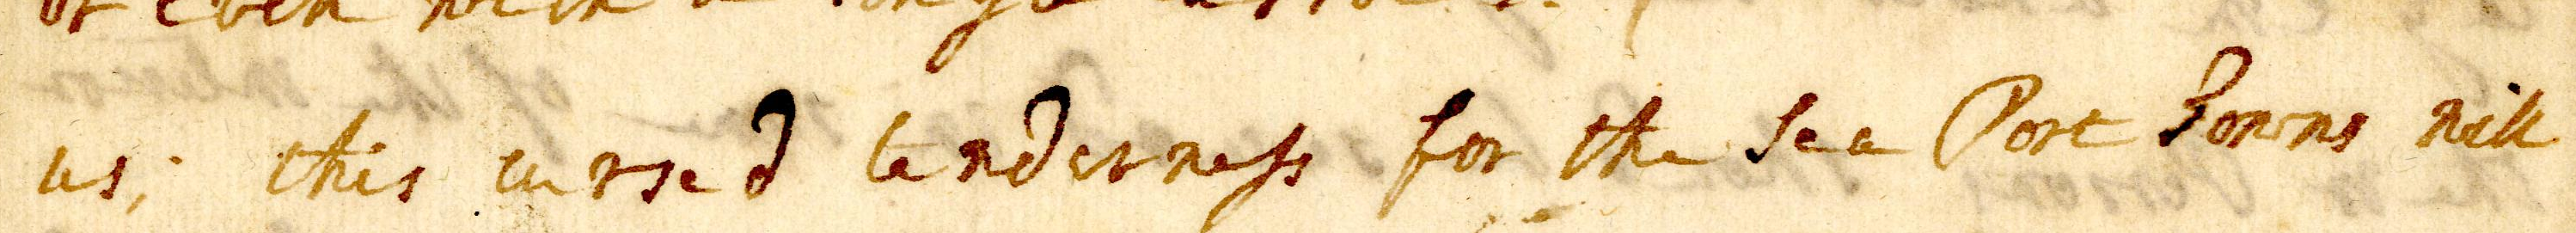us; this cursed tenderness for the sea Port Towns, will
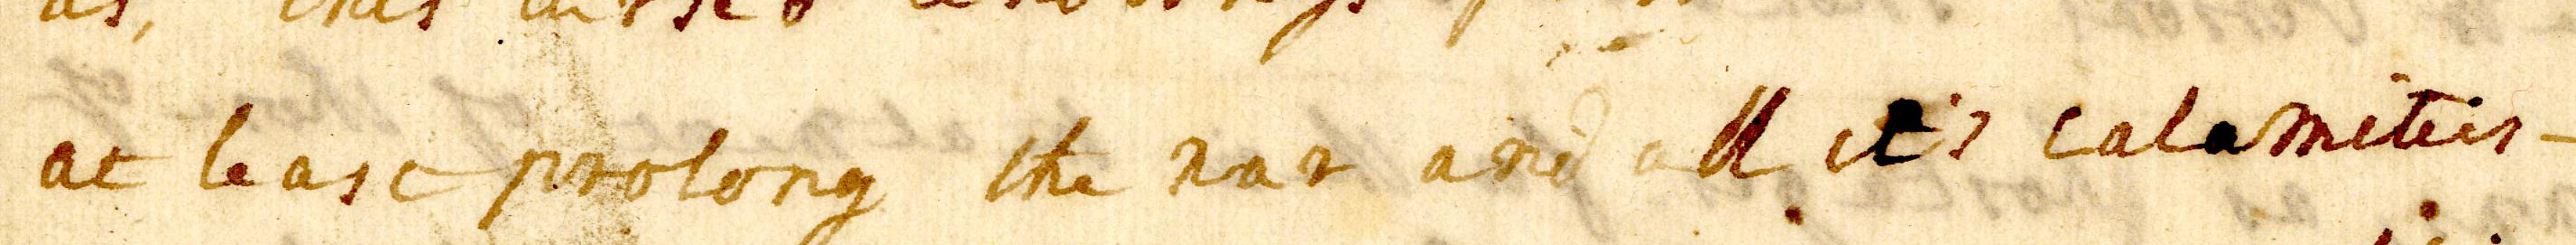at least prolong the war and all its calamities-
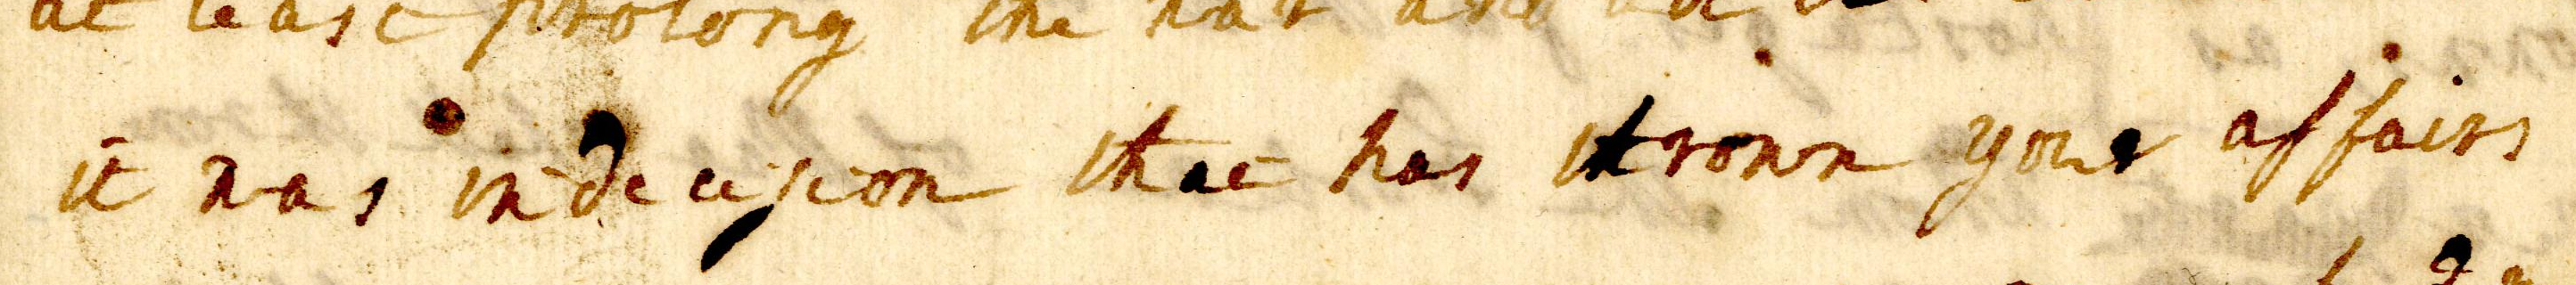it was indecision than has thrown your affairs
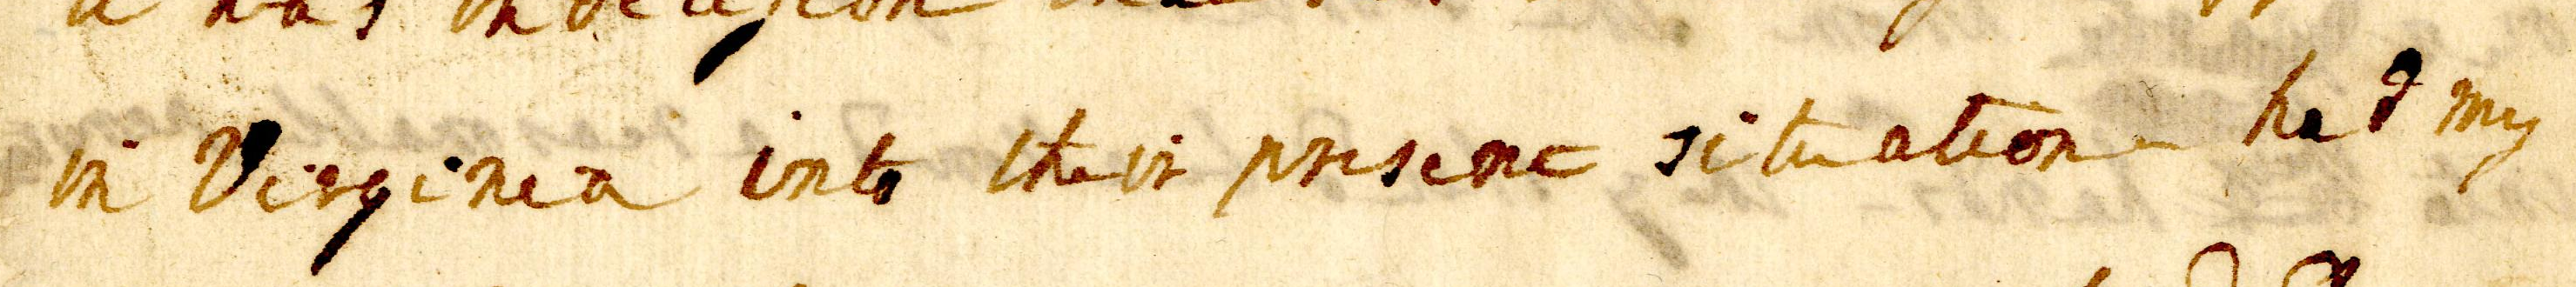in Virginia into their present situation- had my
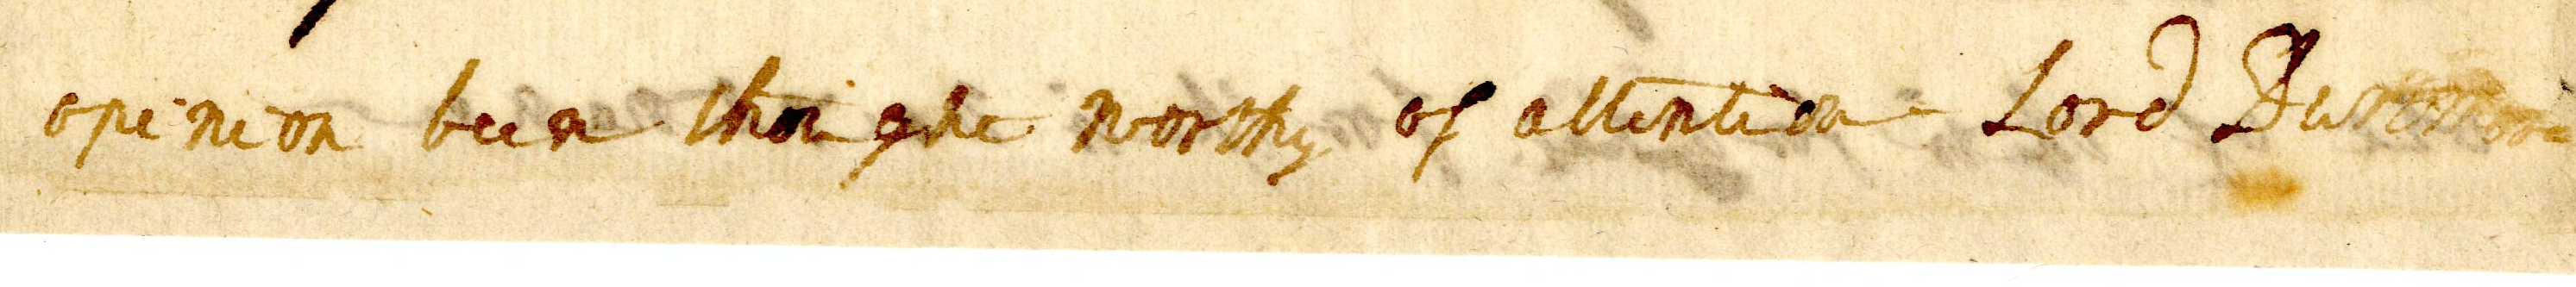opinion been thought worthy of attention Lord Durion
